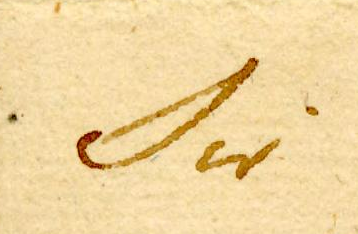Sir
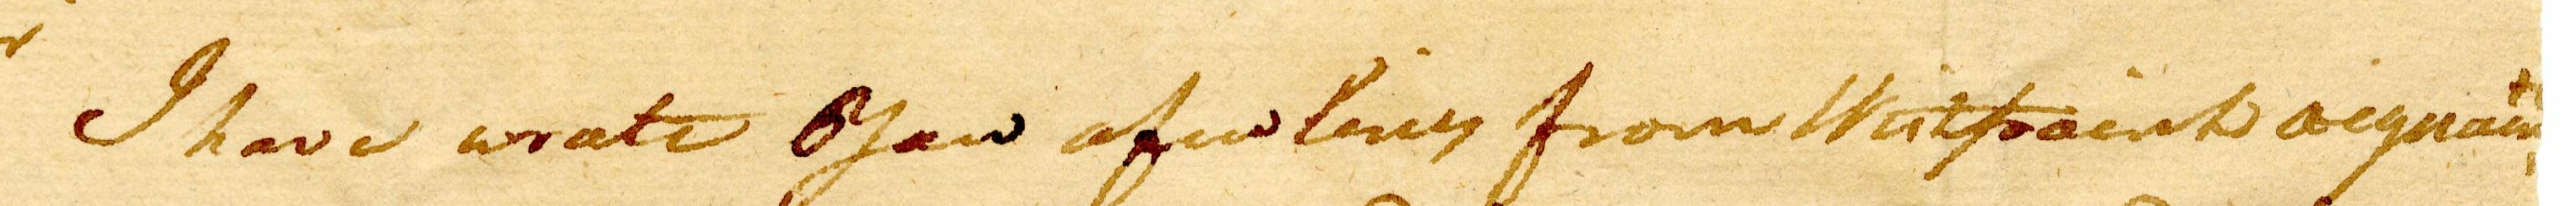I have wrote you a few lines from Westpoint acquain^t
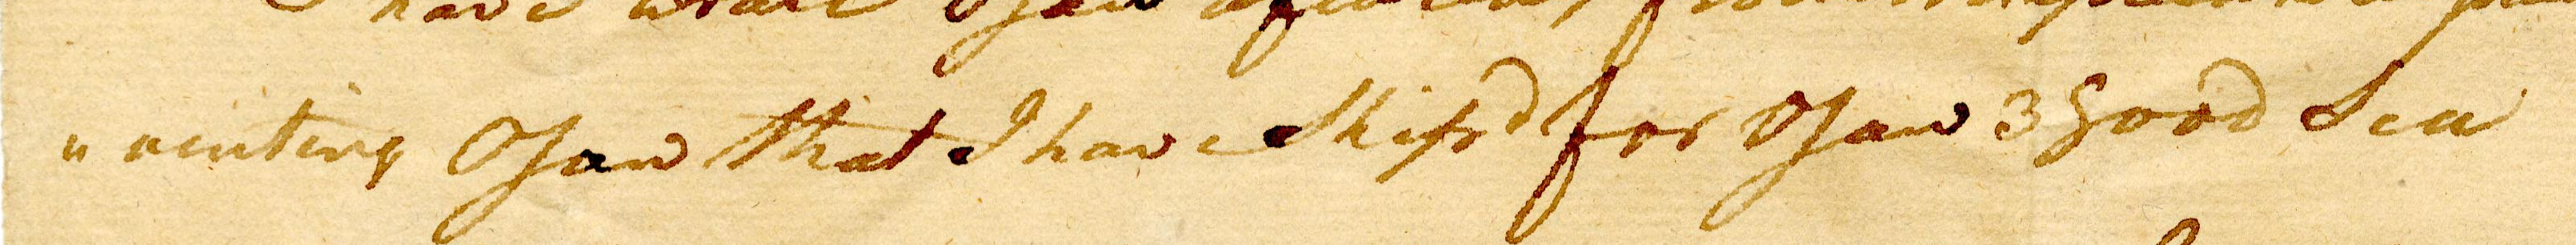uainting you that I have Ship^d for you 3 good Sea
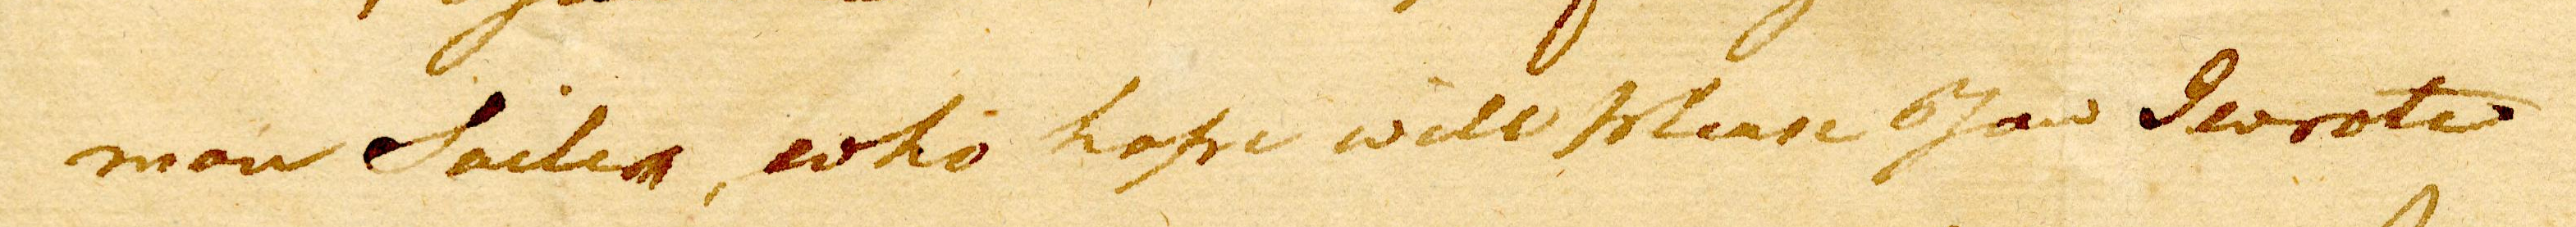man Sailes, who hope will please you I wrote
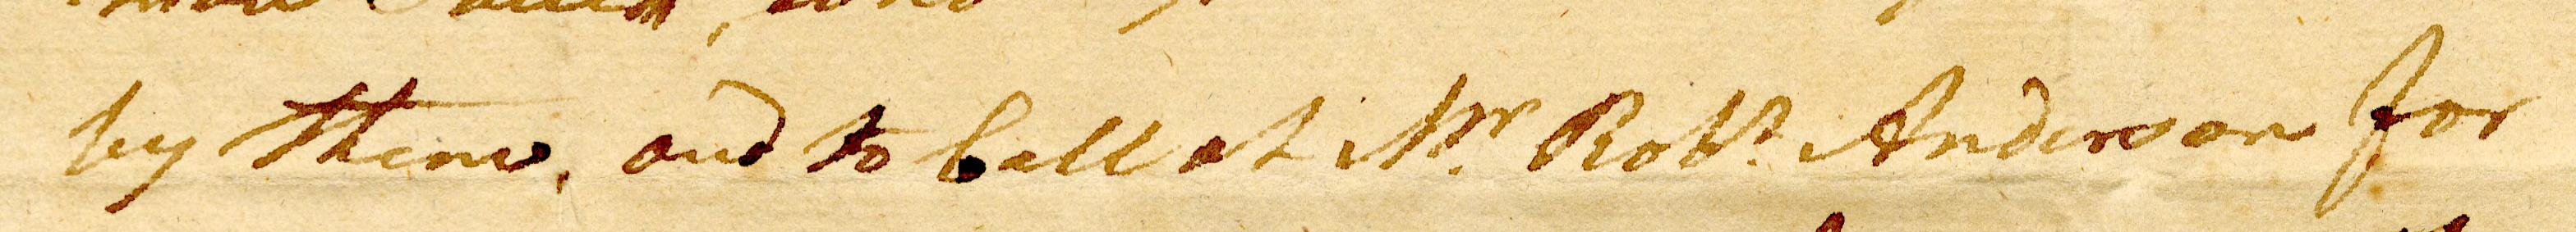by them, and to Call at M^r. Rob^t. Anderson for
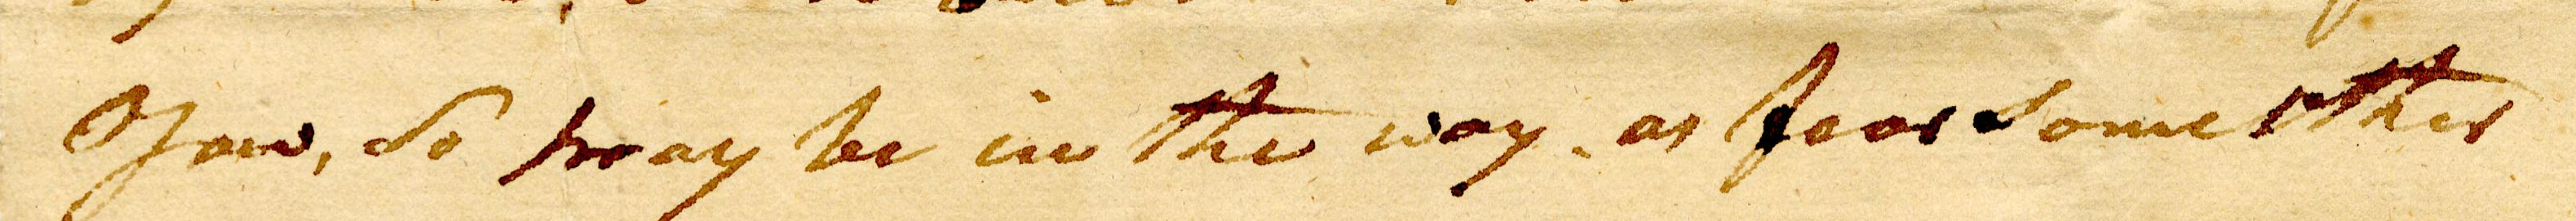You, so pray be in the way as fear Some other
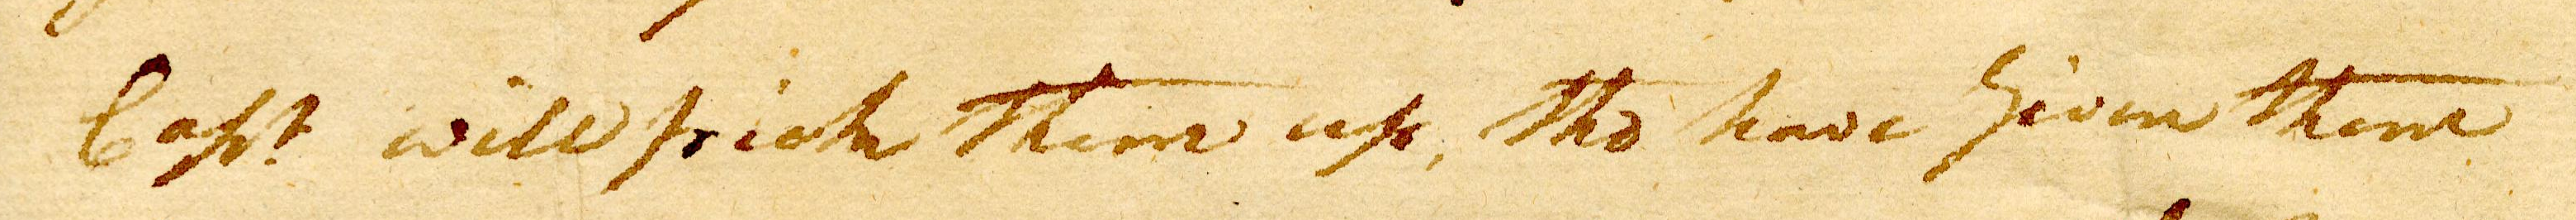Cap^t. will pick them up, tho have Given them
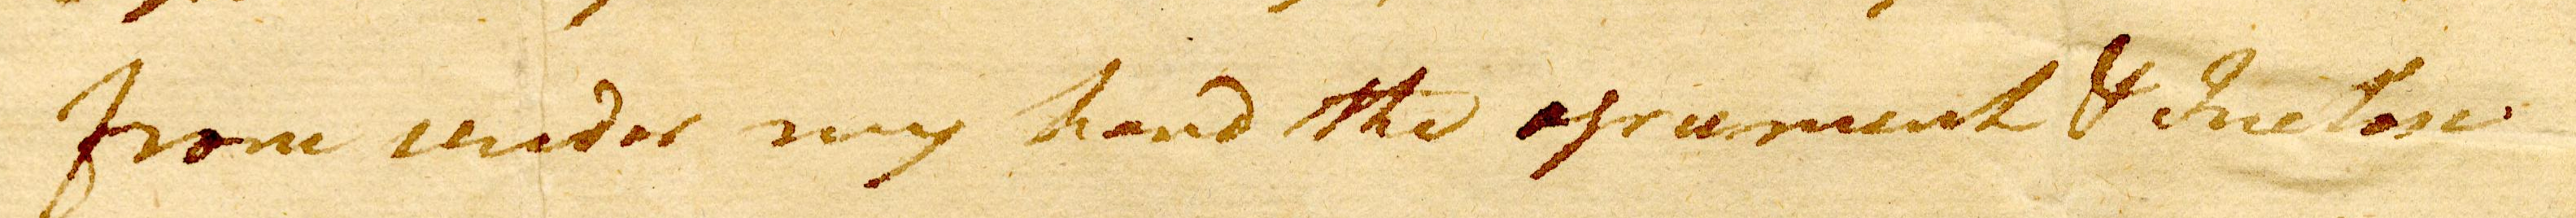from under my hand the agreement & Inclose
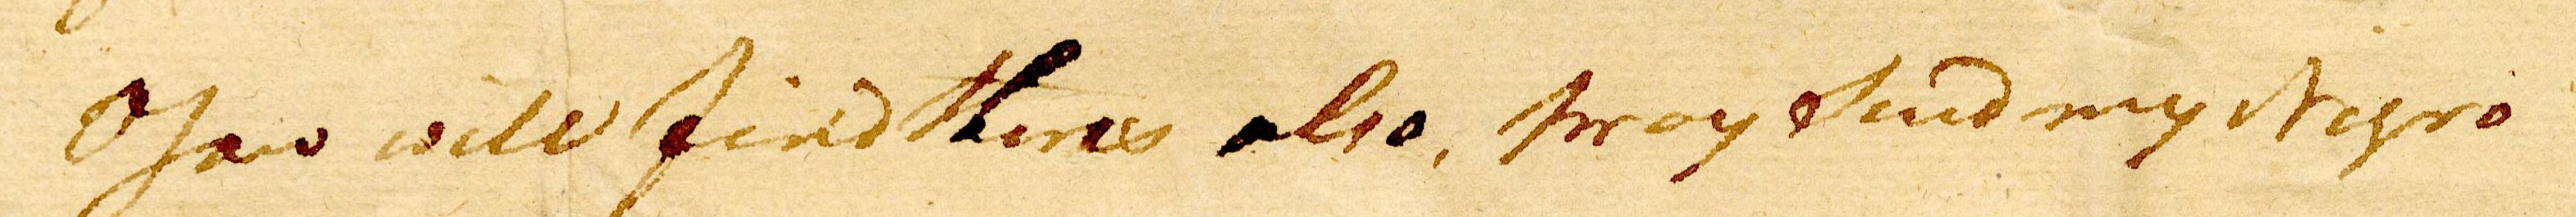You will find theres also, pray send my Negro
